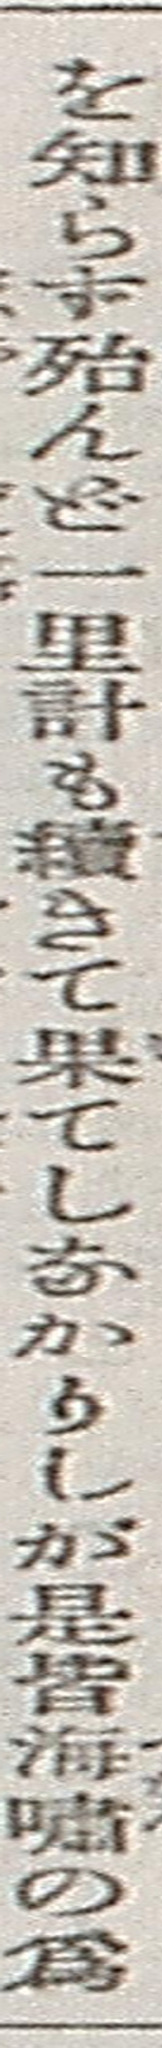を知らず殆んど一里計も続きて果てしなかりしが是皆海嘯の為
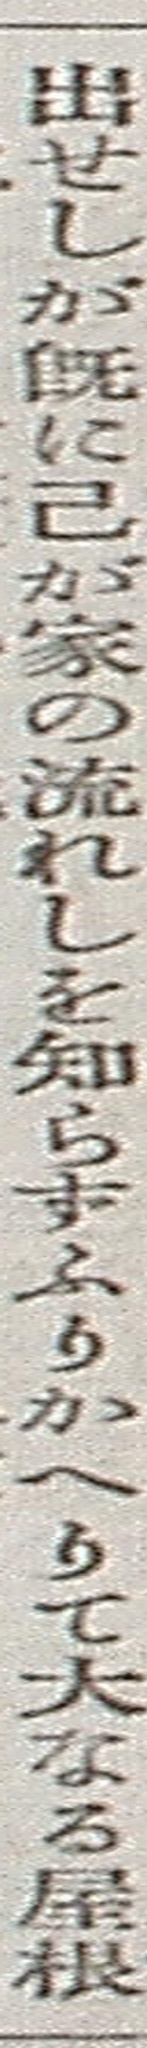出せしが既に己が家の流れしを知らずふりかへりて大なる屋根
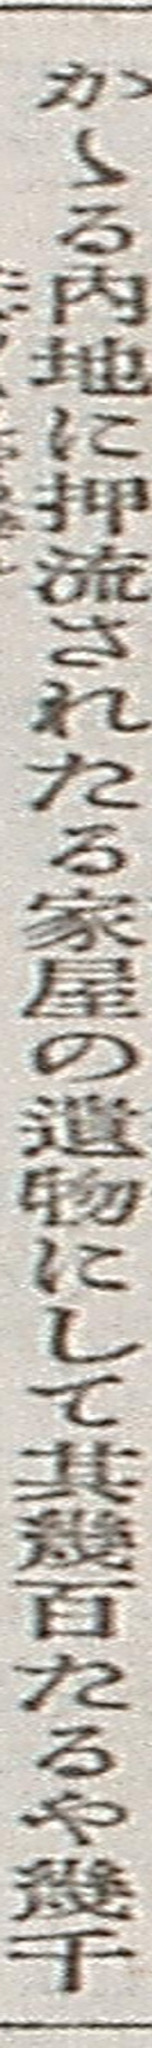かゝる内地に押流されたる家屋の遺物にして其幾百たるや幾千
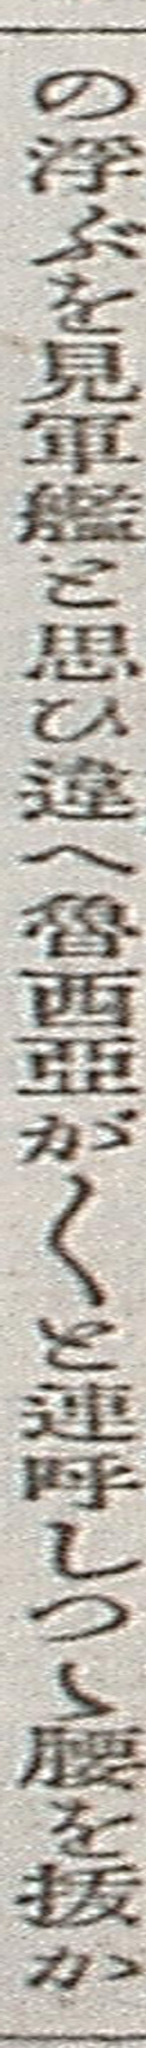の浮ぶを見軍艦と思ひ違へ魯西亜が〳〵と連呼しつゝ腰を抜か
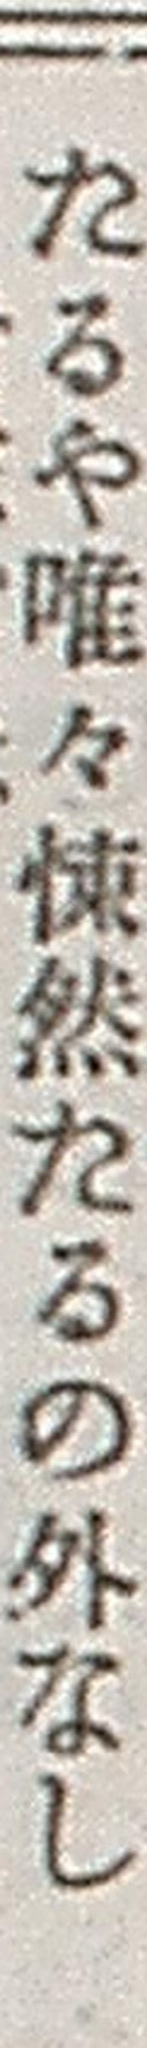たるや唯々悚然たるの外なし
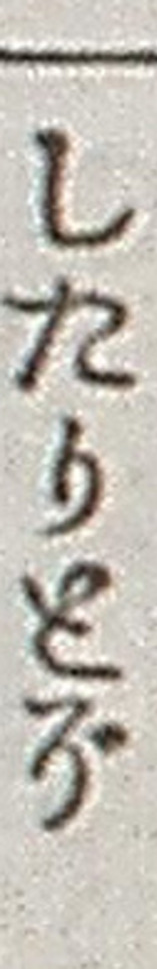したりとぞ
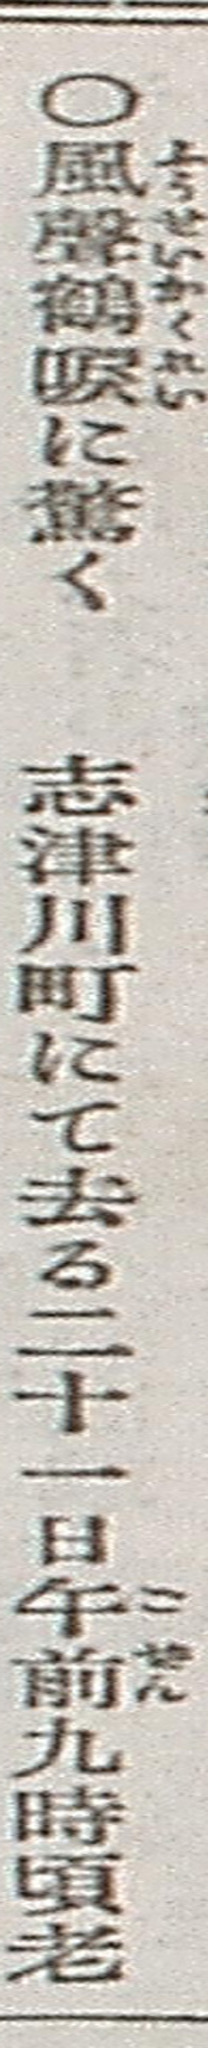○風声鶴唳に驚く志津川町にて去る二十一日午前九時頃老

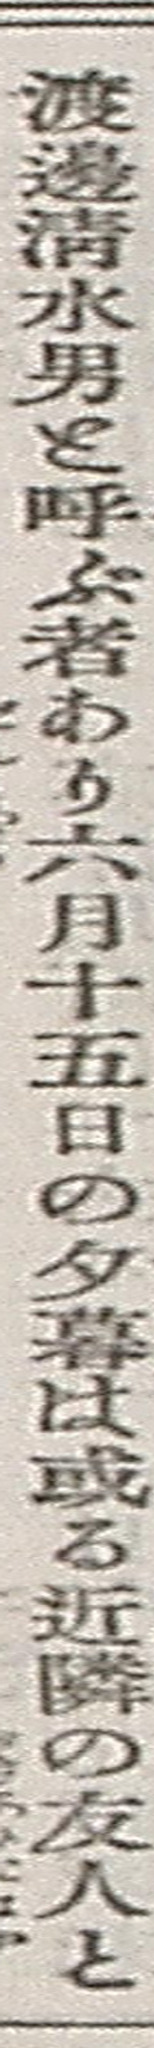渡邊清水男と呼ぶ者あり六月十五日の夕暮は或る近隣の友人と
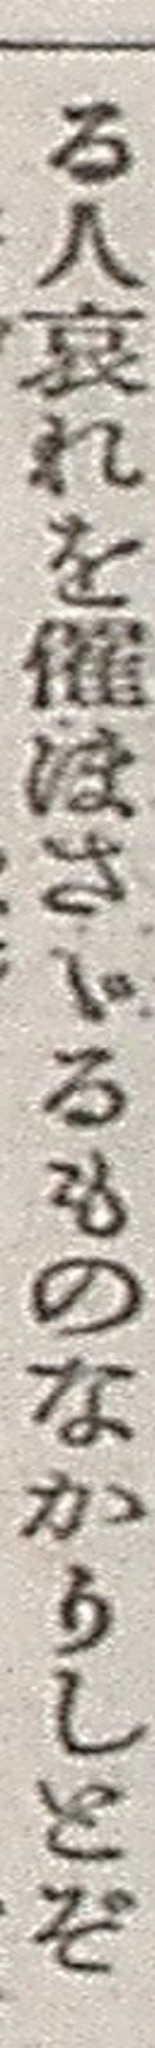る人哀れを催ほさゞるものなかりしとぞ
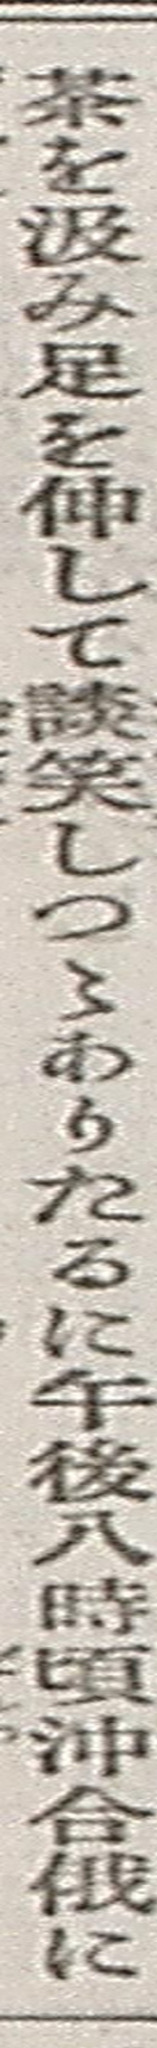茶を汲み足を伸して談笑しつ〻ありたるに午後八時頃沖合俄に
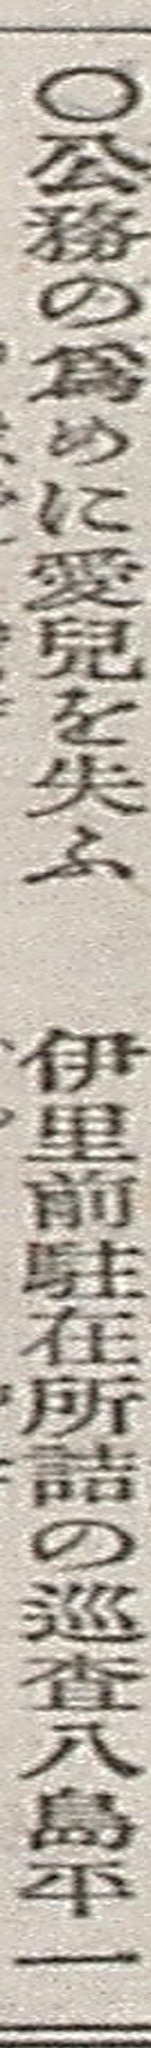〇公務の為に愛児を失ふ伊里前駐在所詰の巡査八島平一
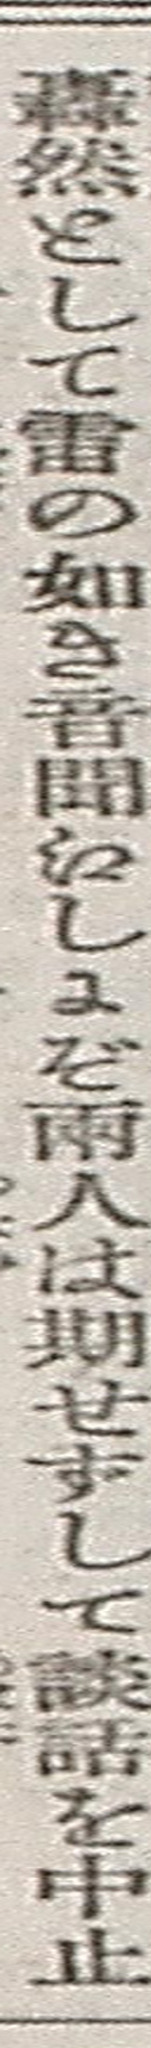轟然として雷の如き音聞えしにぞ両人は期せずして談話を中止
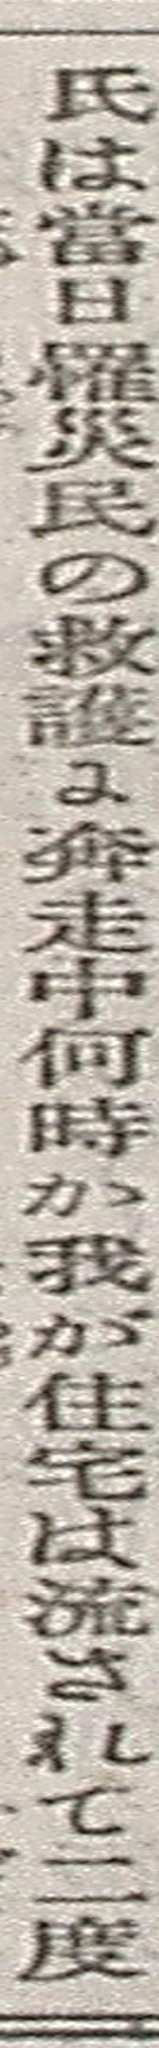氏は当日罹災民の救護に奔走中何時か我が住宅は流されて二度
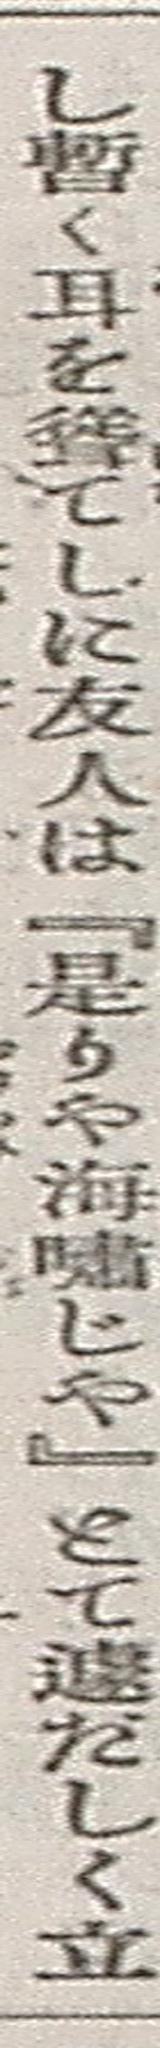し暫く耳を聳しに友人は「是りや海嘯じや」とて遽だしく立
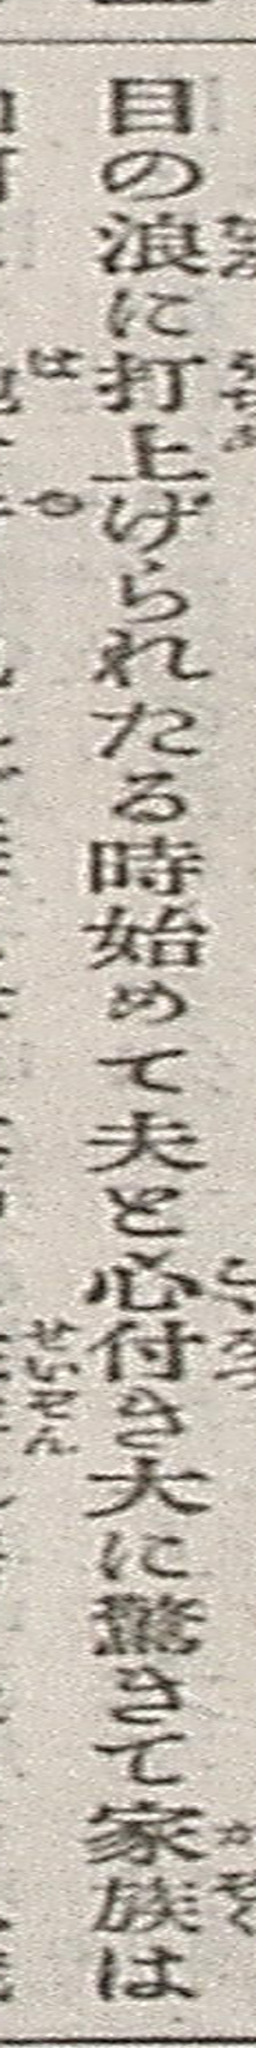目の浪に打上げられたる時始めて夫と心付き大に驚きて家族は
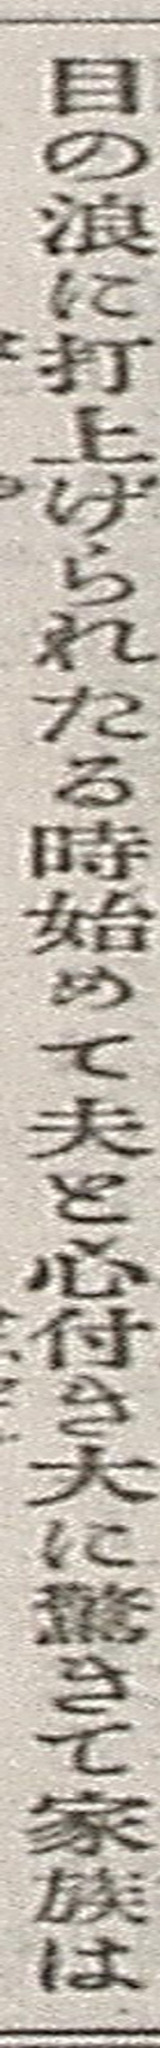目の浪に打上げられたる時始めて夫と心付き大に驚きて家族は
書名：風俗畫報臨時増刊第百十九號　大海嘯被害録（中）
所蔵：東京大学地震研究所図書室 Earthquake Research Institute Library, The University of Tokyo, JAPAN
